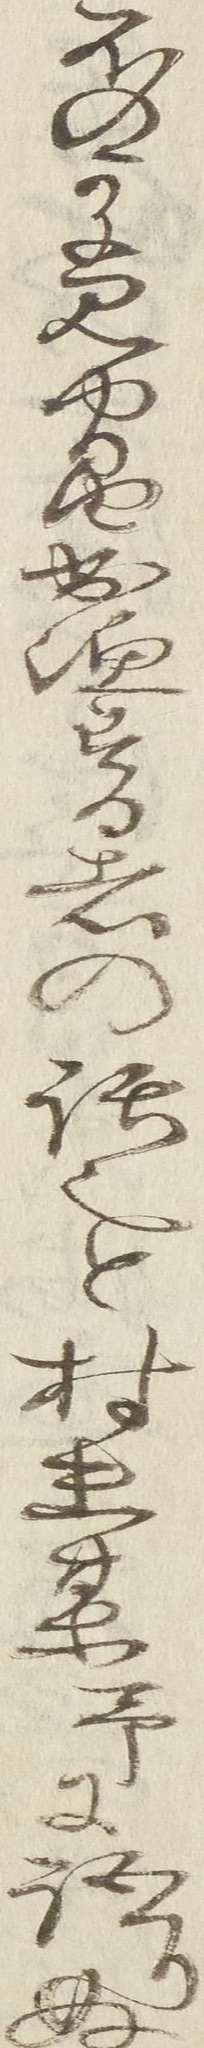ほのかに見ゆる由出漁する者の話也と村夫某予に語りぬ
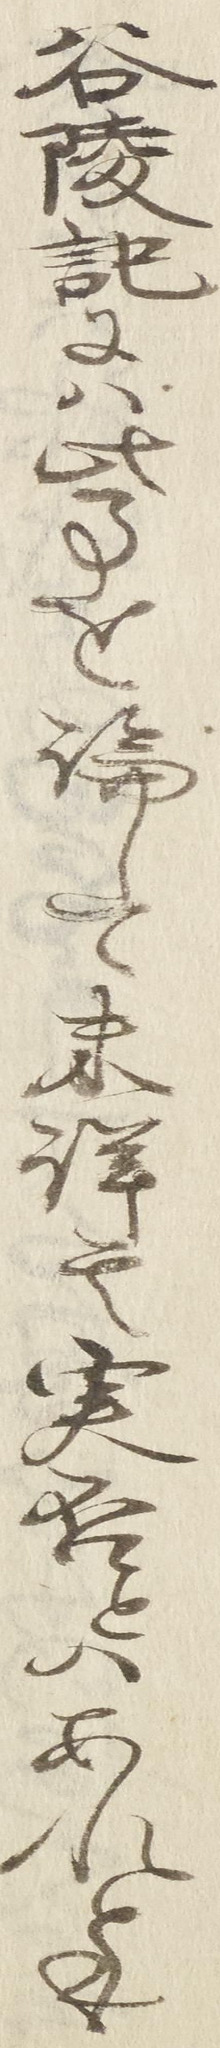谷陵記には此事を論して未詳其実否とはあれとも
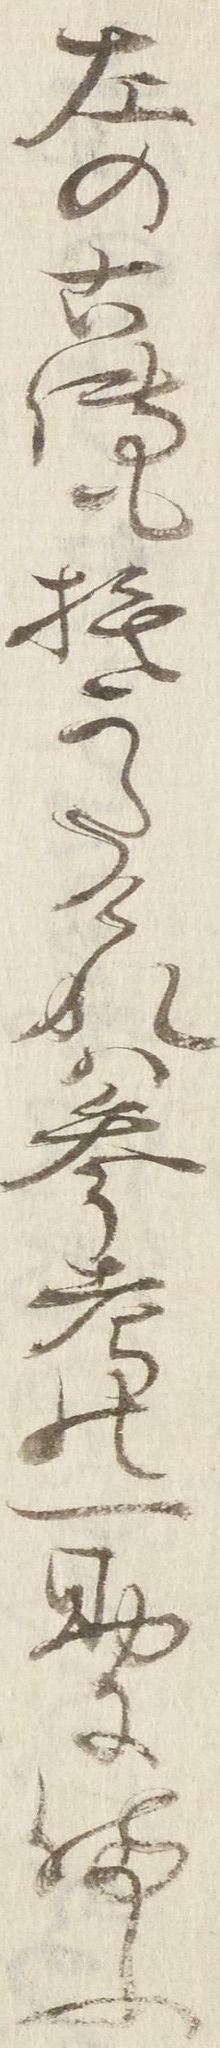左の古伝も捨かたけれは参考の一助に備ふ
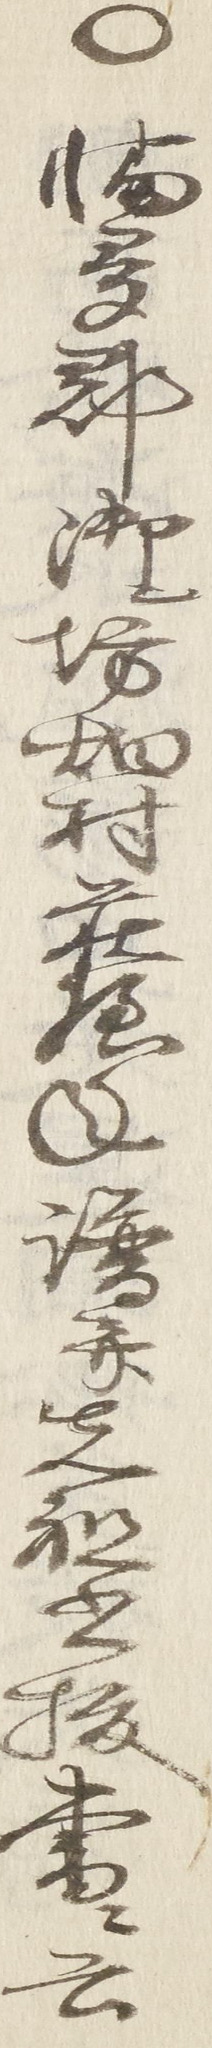〇幡多郡御坊畑村荘屋年譜并先祖書抜書二云
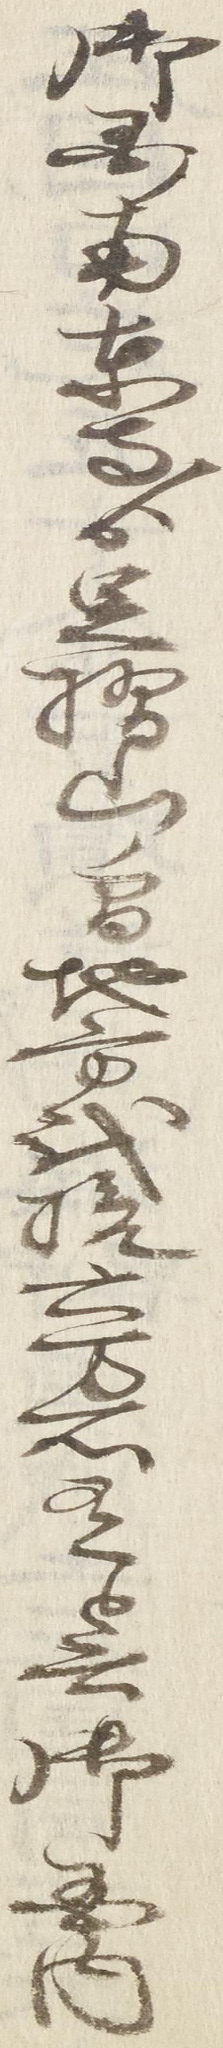御国南東寺ゟ足摺山ノ間地方弐拾六万石有と云御国内
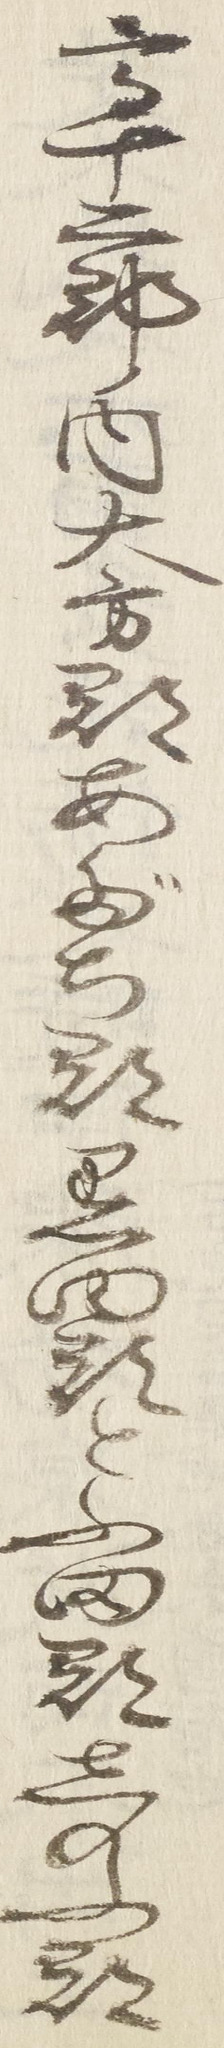高十二郡ノ内大方郡あだち郡黒田郡とふ田郡しのふ郡
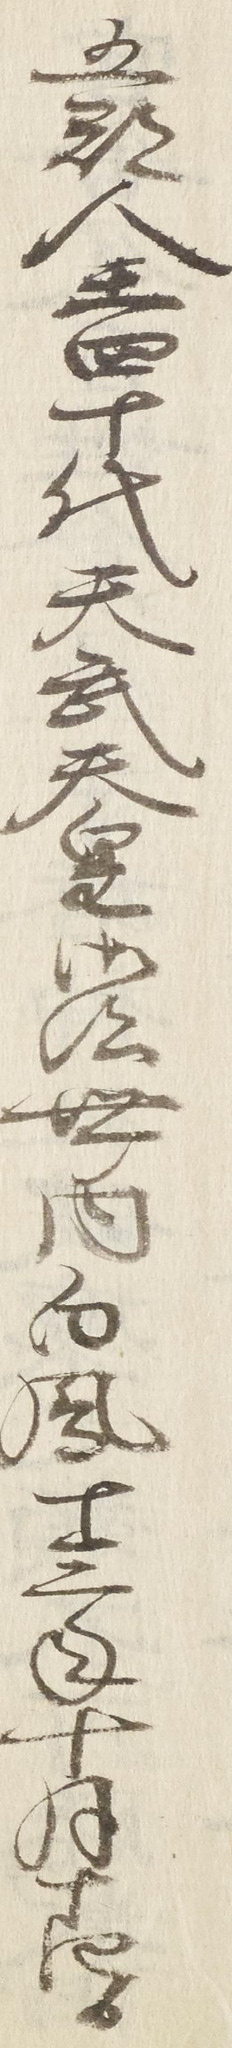五郡人王四十代天武天皇御治世ノ内白鳳十三年十月十四日
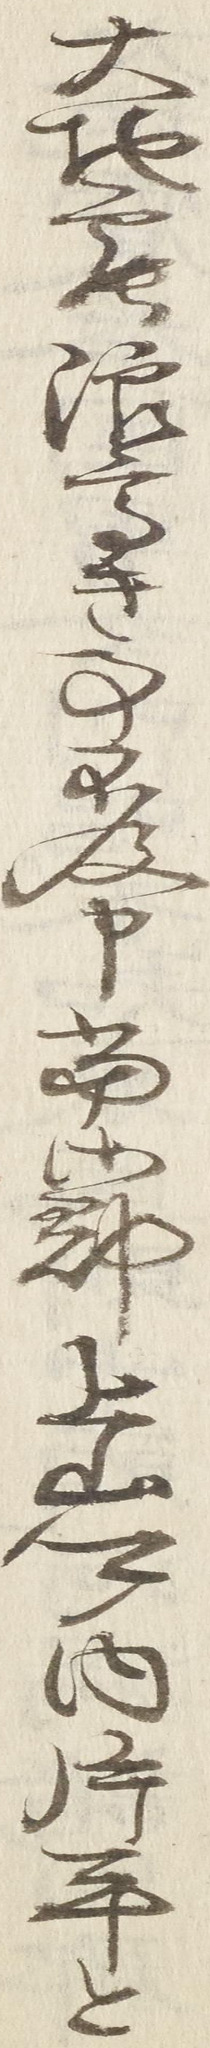大地震浪高き事不及申当御郡上山郷ノ内片平と
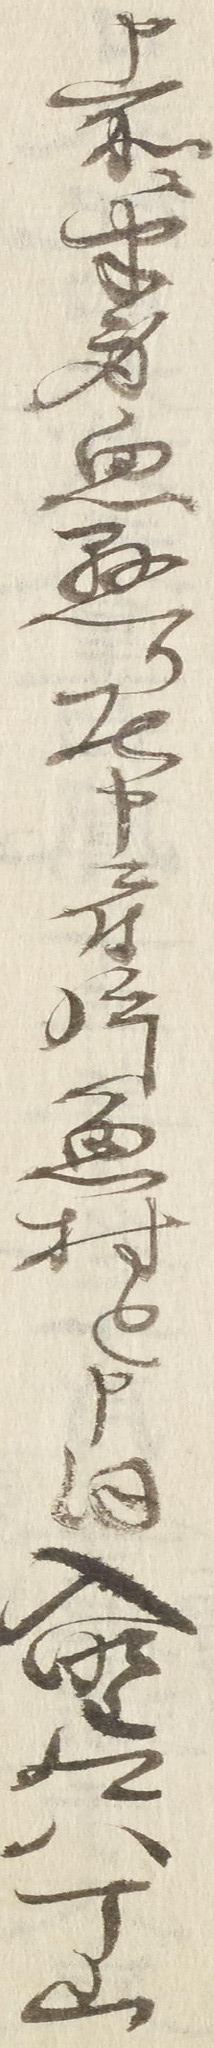申所二半身魚懸り居申二付片魚村と申同入野郷八丁山
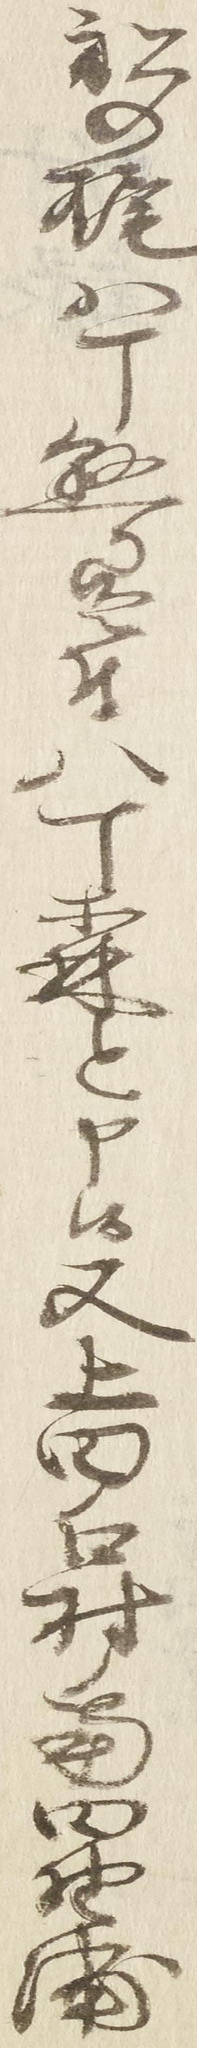船の梶八丁懸り候二付八丁森と申候又上田ノ口村の南田野浦
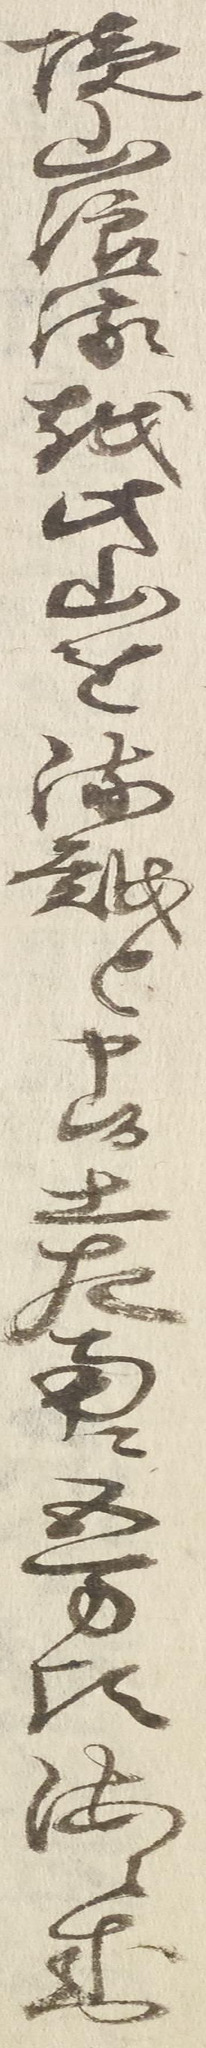境山浪流越此山を流越と申候土左南二五万頃海に成
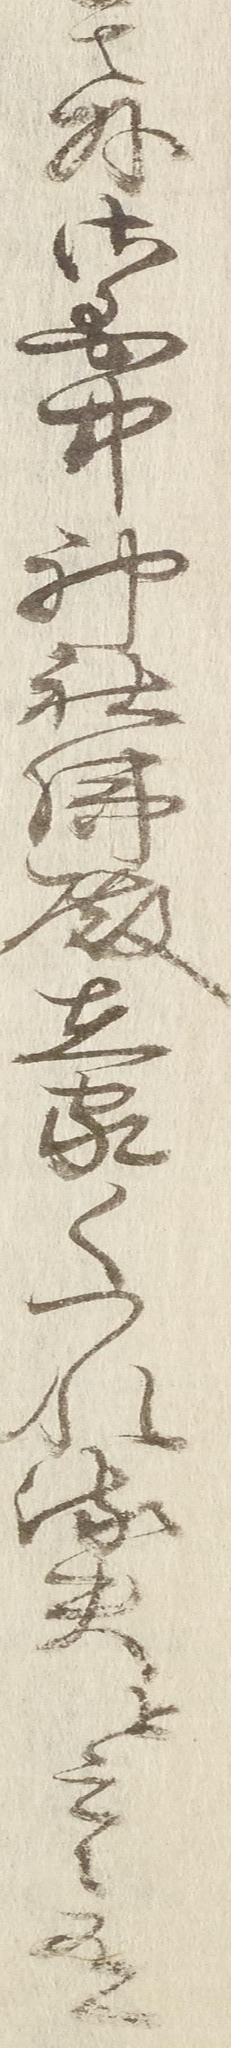其外御国中神社仏殿在家くつれ流と云々有之
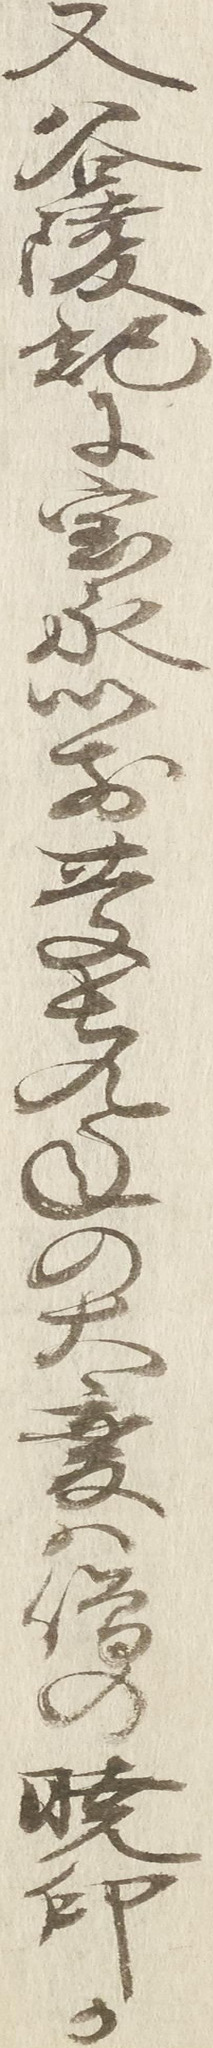又谷陵記に宝永以前慶長九年の大変は僧の暁印か
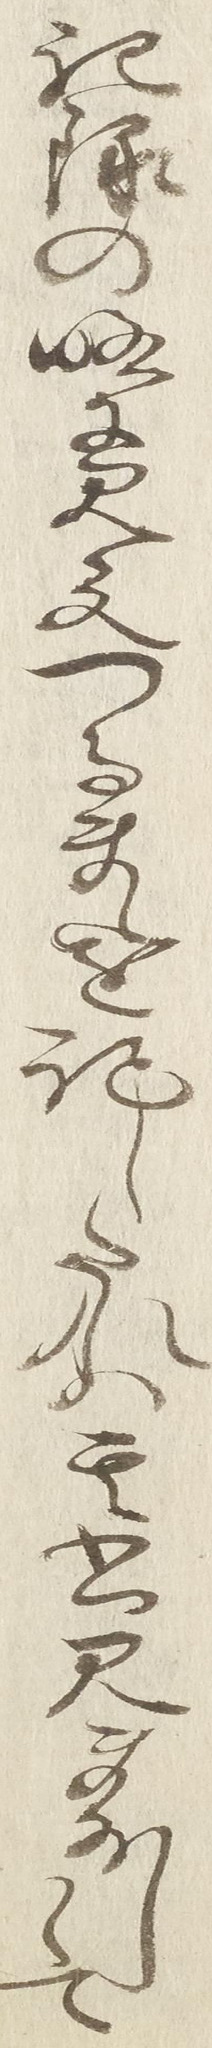記録の畧に見たへつるまゝを記したれは其書見まほしくて
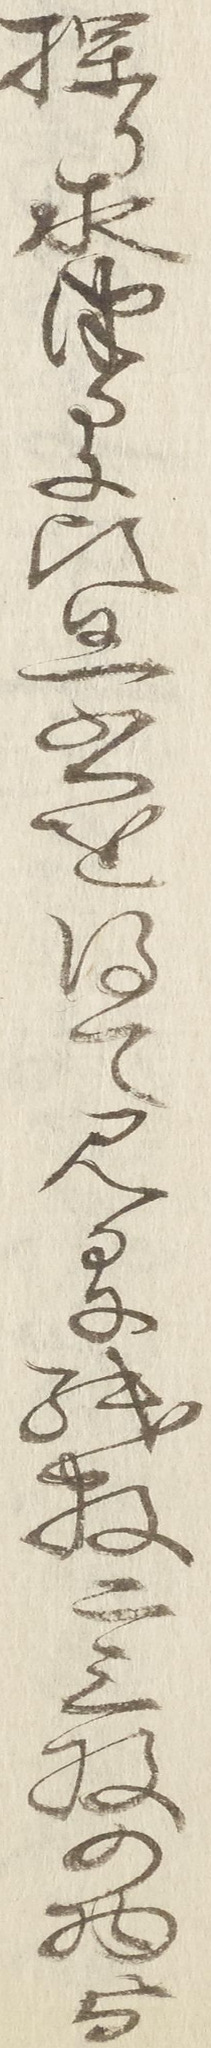探り求つるに頃旦書を得て見るに紙数二三枚の物に而
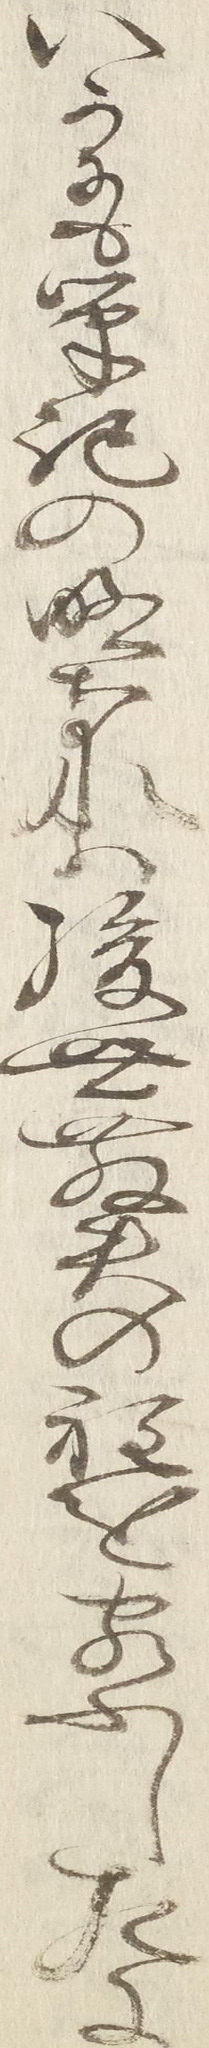いかにも筆記の略なれは後世散失の程を察し左に
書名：地震記　下
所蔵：東京大学地震研究所図書室 Earthquake Research Institute Library, The University of Tokyo, JAPAN
